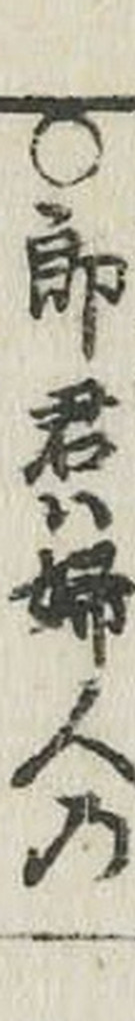○郎君は婦人の
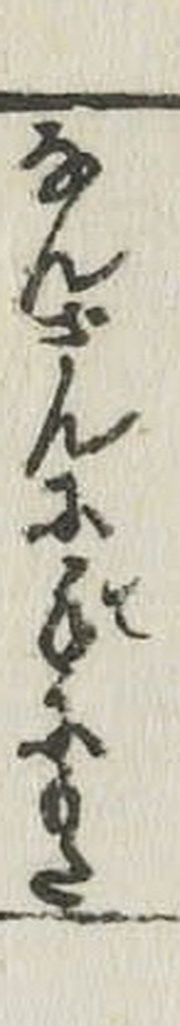なんざんに手にもた
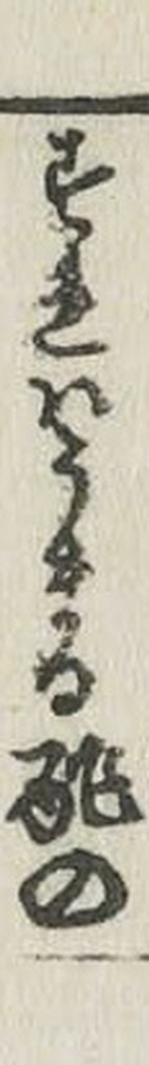すれはうまる酢の
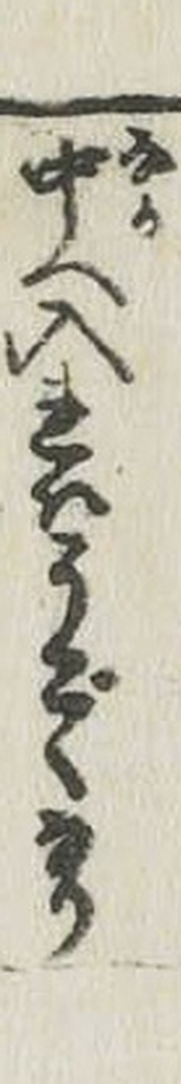中へ入れはうごくなり
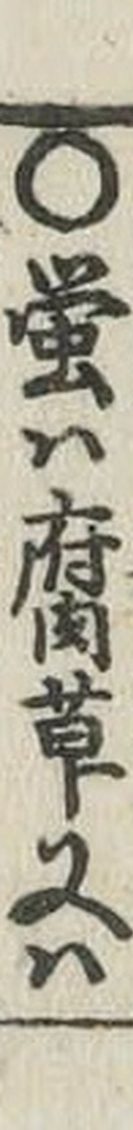○蛍は腐草又は
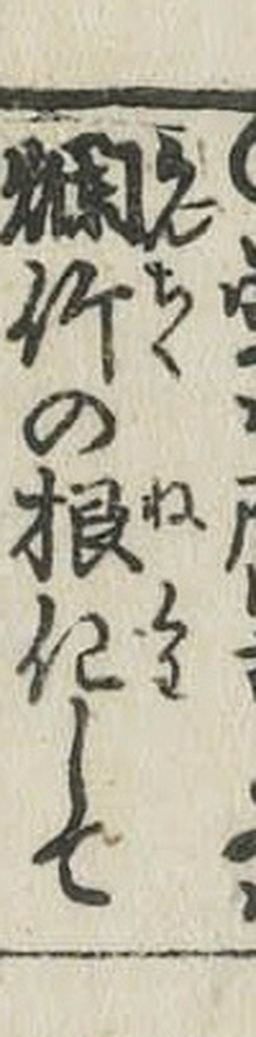爛竹の根化して
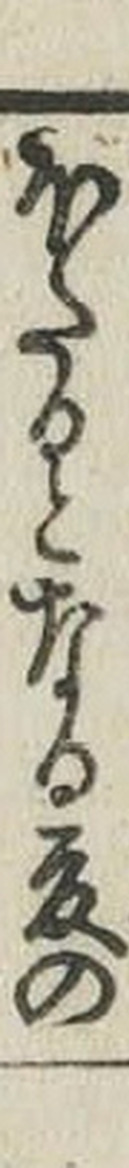ほたるとなる夏の
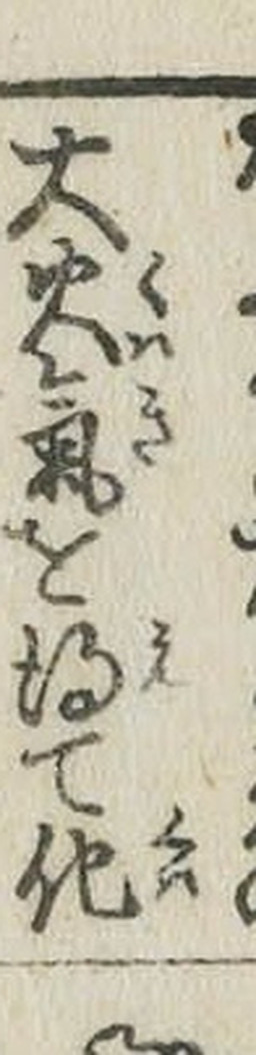大火気を得て化
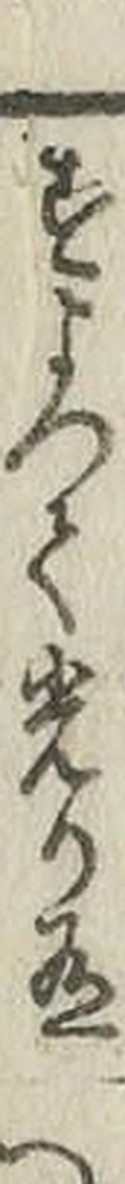すよつて光り有
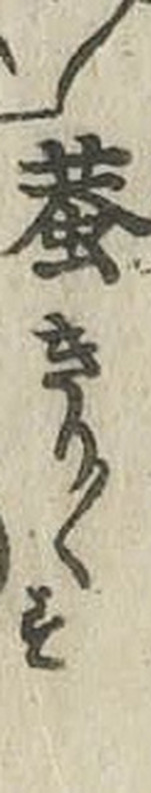蛬きり〳〵す
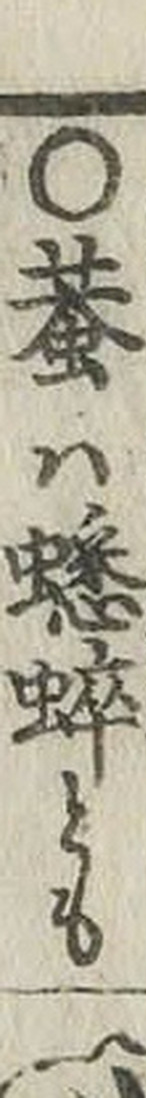○蛬は蟋蟀とも
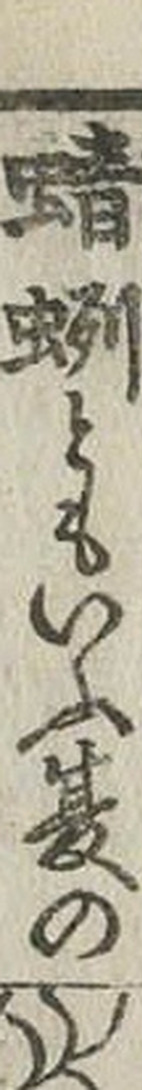蜻蛚ともいふ夏の
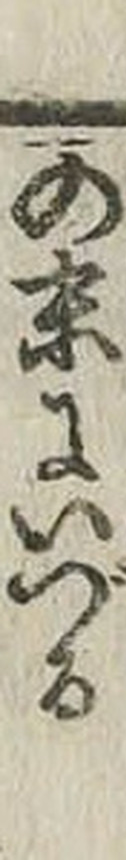の末にいづる
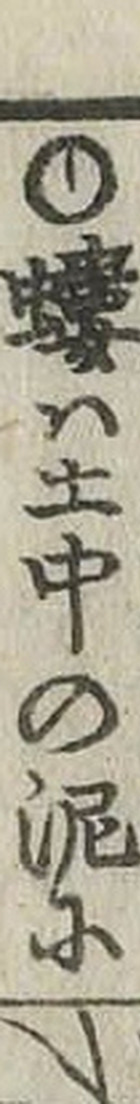○螻は土中の泥に
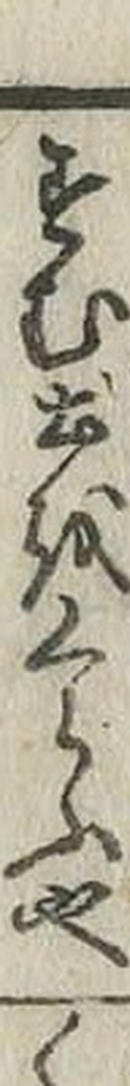すむ土をくらふや
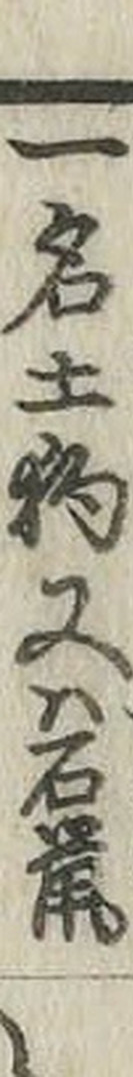一名土狗又は石鼠
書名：増補頭書訓蒙図彙大成 10巻 7:巻之14-16
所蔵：東京学芸大学教育コンテンツアーカイブ
